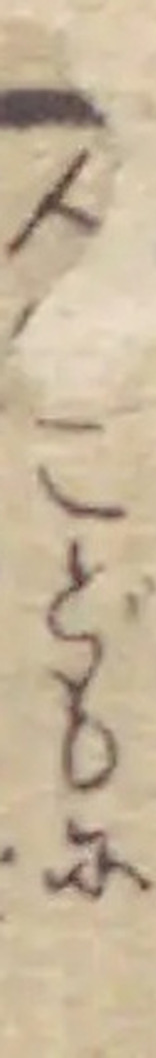人こどもに
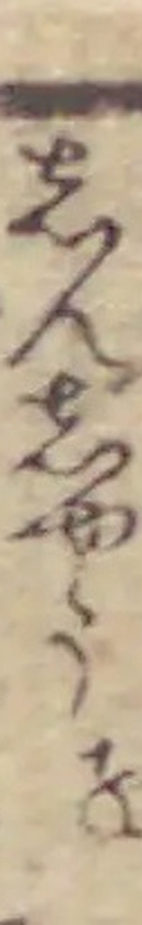しんしやうを
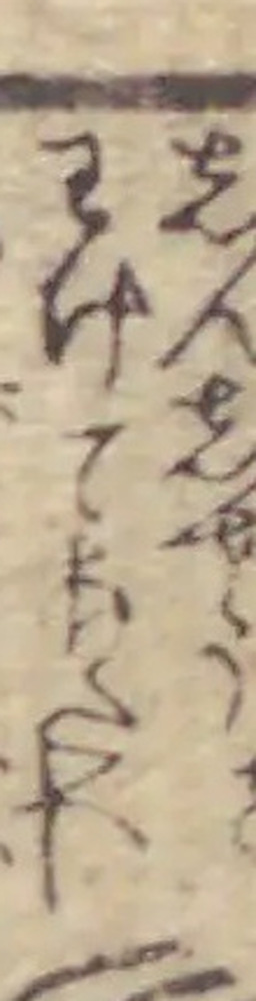わけてあたへし
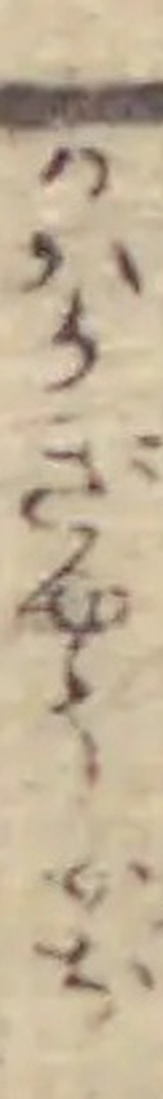かはかぢやうお
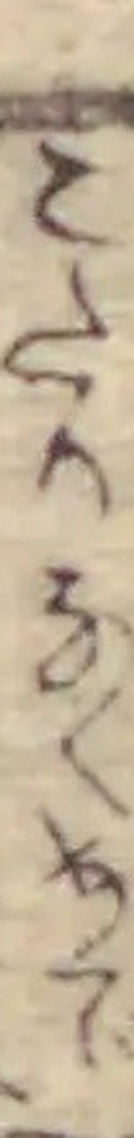こたりなくめで
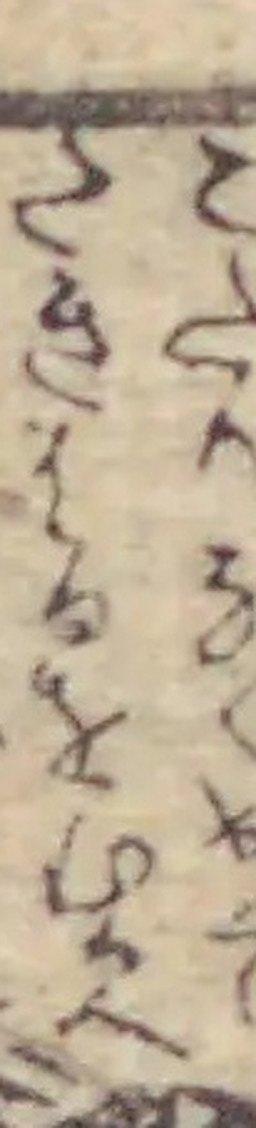たきはるをむかへ
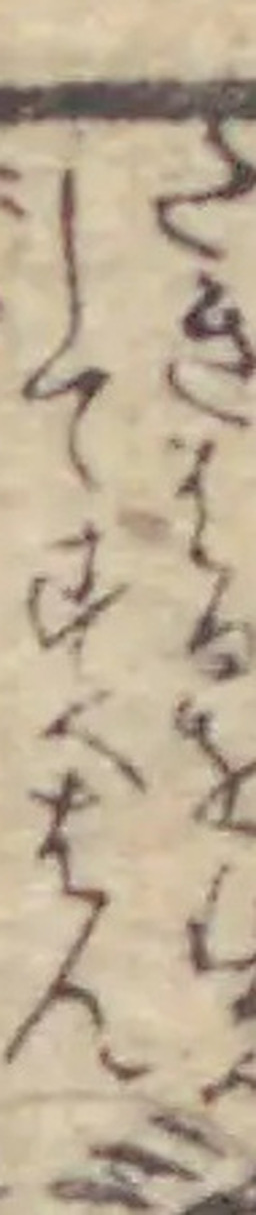してすへはん
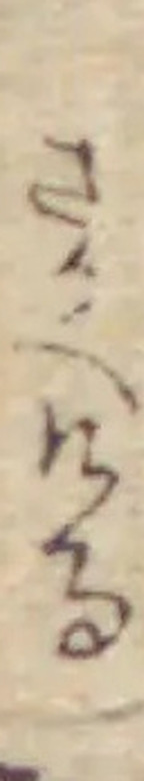さかへける
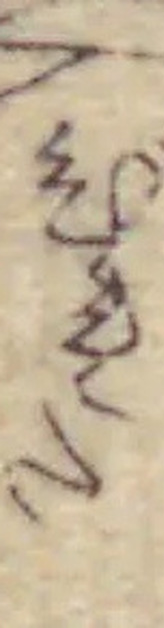びれた
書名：餅酒腹中能同志 2巻
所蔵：国立国会図書館 National Diet Library, JAPAN
